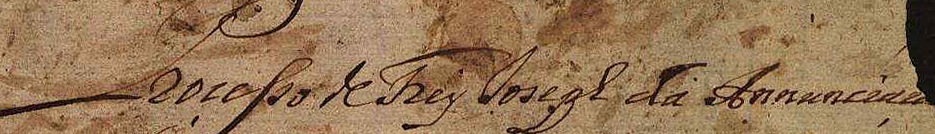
Processo de Frey Ioseph da Annunciaç
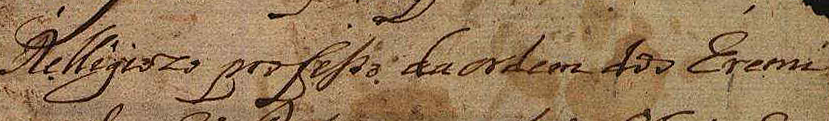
Relligiozo professo da ordem dos Eremi
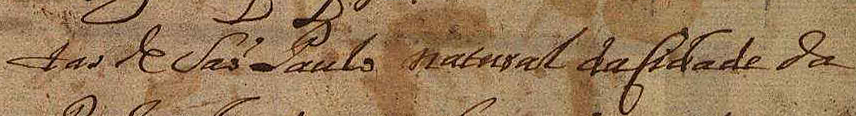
tas de Saõ Paulo natural da Cidade da
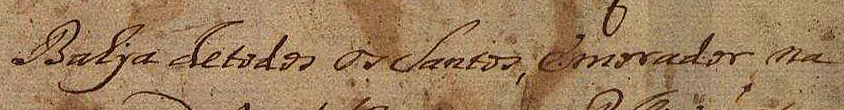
Bahya de todos os Santos, e morador na
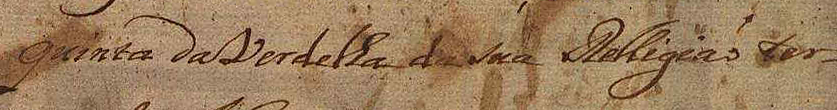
quinta da Verdelha da sua Relligiaõ ter
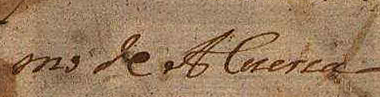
mo de Aluerca
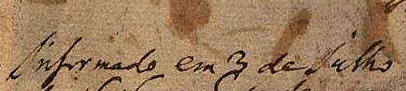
Informado em 3 de Iulho
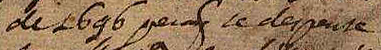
de 1696 pera q̄ se despense
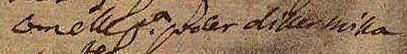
com elle p.a poder disser missa
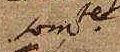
som.te
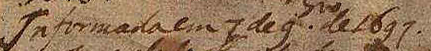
Jnformada em 7 de 9.ro de 1697.
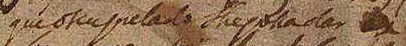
que o seu prelado lhe possa dar
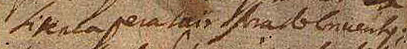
lisença pera sair fora do conuento;
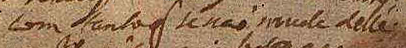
comtanto q̄ se naõ mude delle
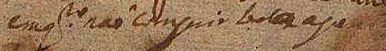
emq.to naõ comprir toda a peni
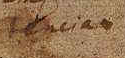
tencia.
